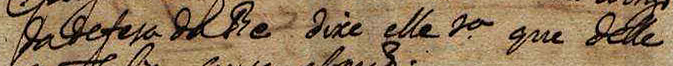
da defesa da Re dixe elle t.a que delle
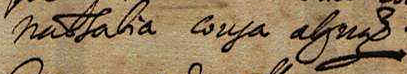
naõ sahia cousa alguā.
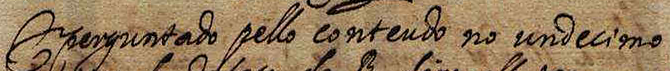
E perguntado pello conteudo no undecimo
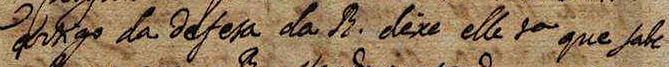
artigo da defesa da R. dixe elle ta que sabe
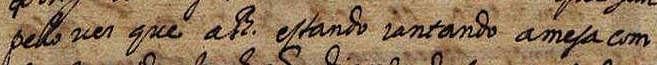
pello uer que a R. estando iantando a mesa com
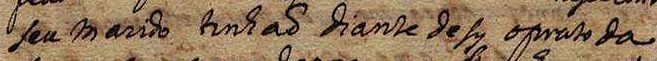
seu marido tinhaõ diante de sy o prato da
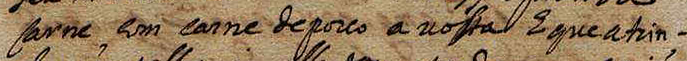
Carne, com carne de porco a uolta E que a trin
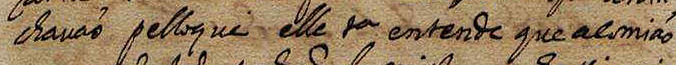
chauaõ pello que elle t.a entende que a comiaõ
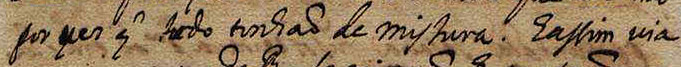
por uer q̄ tudo tinhaõ de mistura. E assim uia
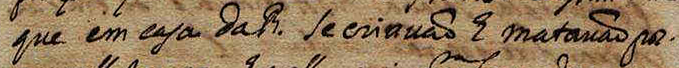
que em casa da R. se criauão E matauaõ por
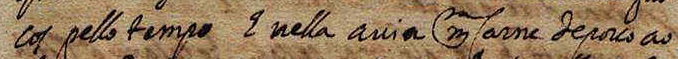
cos pello tempo E nella auia mta Carne de porco ao
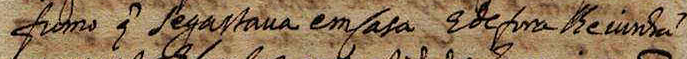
fumo q̄ se gastaua em Casa E de fora lhe uinhā
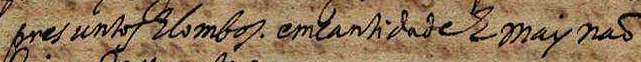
presuntos E lombos. em cantidade E mais naõ
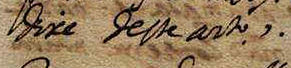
dixe deste arto.
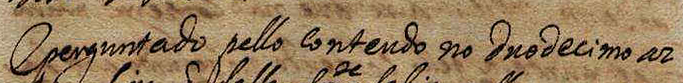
E perguntado pello conteudo no duodecimo ar
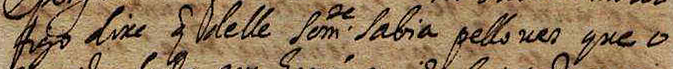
tigo dixe q̄ delle som.te sabia pello uer que o
